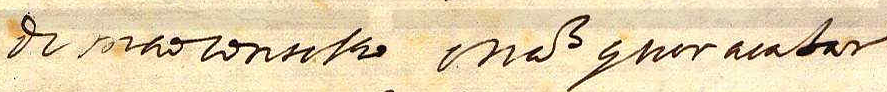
de mao conselho o naõ quer acabar
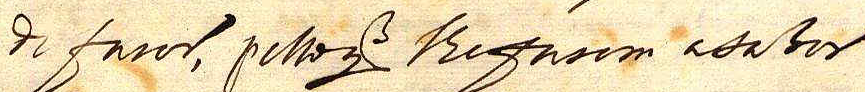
de faser, pello que lhe fasem a saber
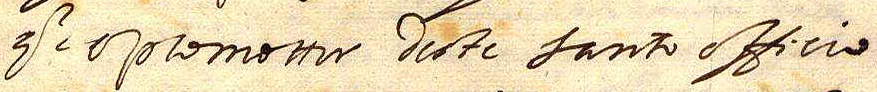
q̄ o promottor deste santo officio
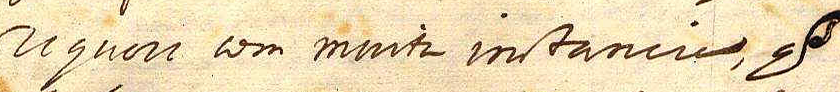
requere com muita instancia, q̄
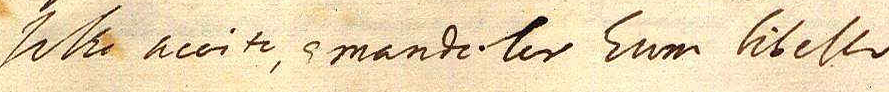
se lhe aceite, E mande ler hum libello
